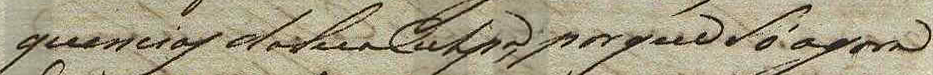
quencias da sua Culpa, porque só agora
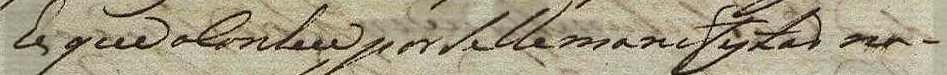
he que o Conhece por selhe manefestar na
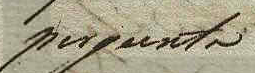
pergunta
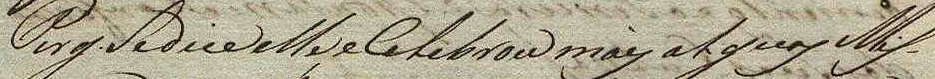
Perg. Se dice elle e Celebrou mais alguas Mis
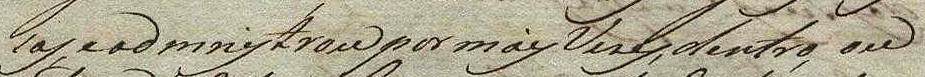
sas, e admnistrou por mais Vezes dentro, ou
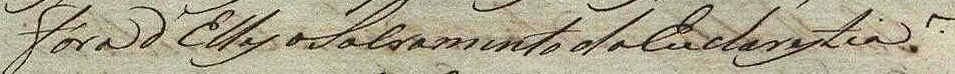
fora d'Ellas o Sacramento da Eucharestia?
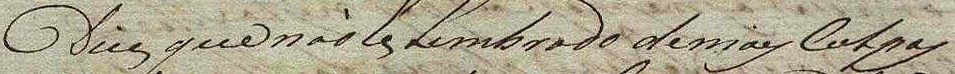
Dice que naõ he Lembrado de mais Culpas
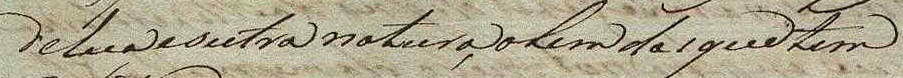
de hua e outra natura, alem das que tem
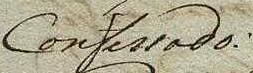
Confessado.
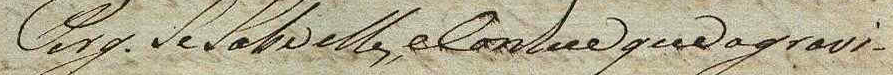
Perg. se sabe elle, e Conhece que a gravi
